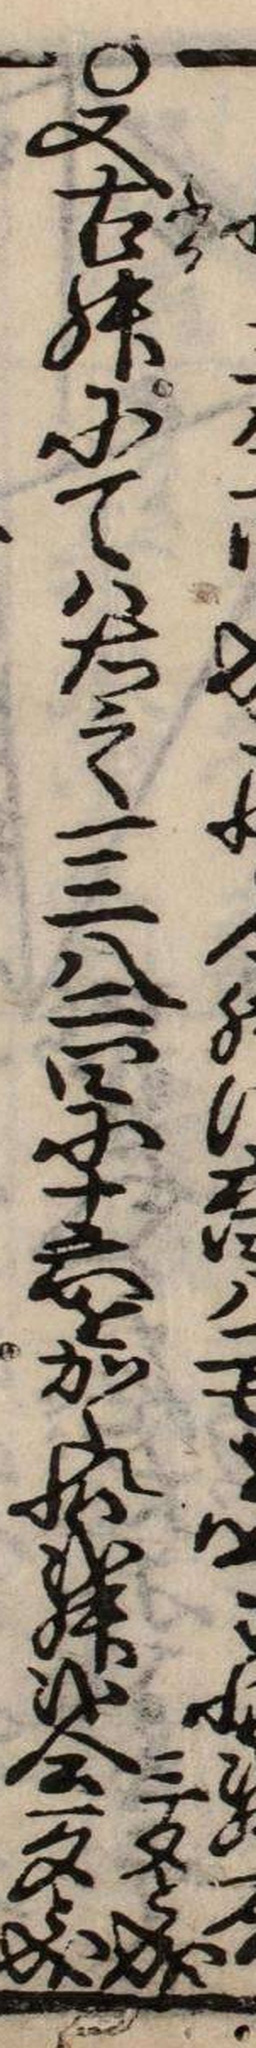○又古舛にては右之一三八二四に十六をかくれは弐升弐合一勺と成
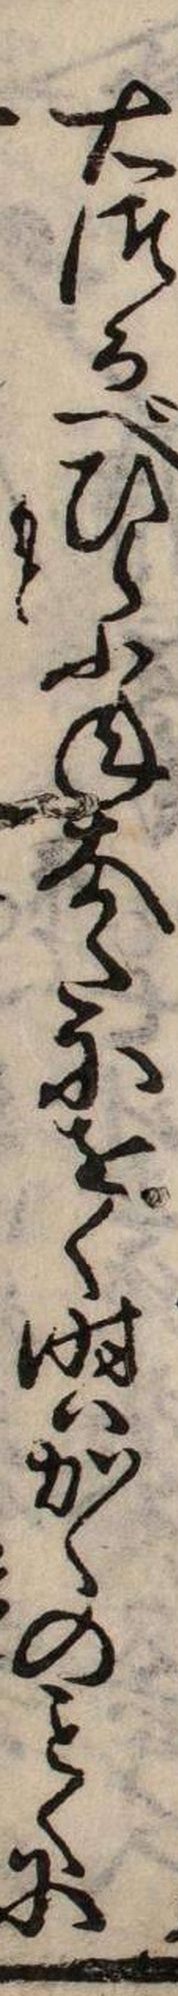右つるべひらふね大かたにをく時はかくのことくに
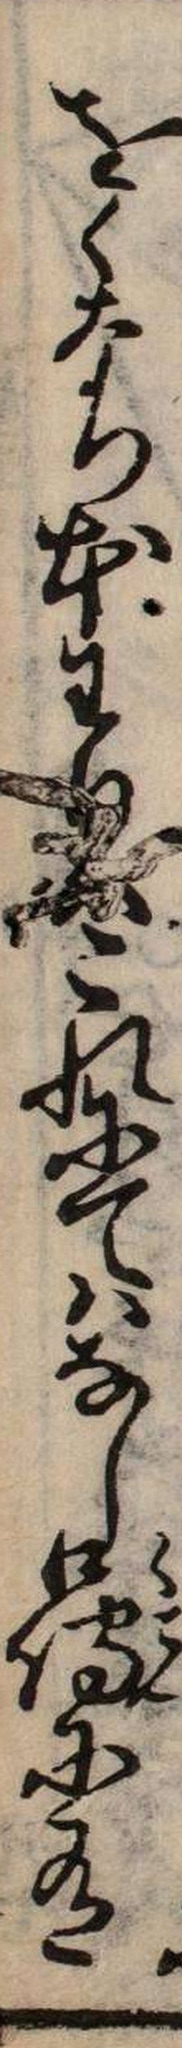をくなり本わりはこれにてはなし口伝に有

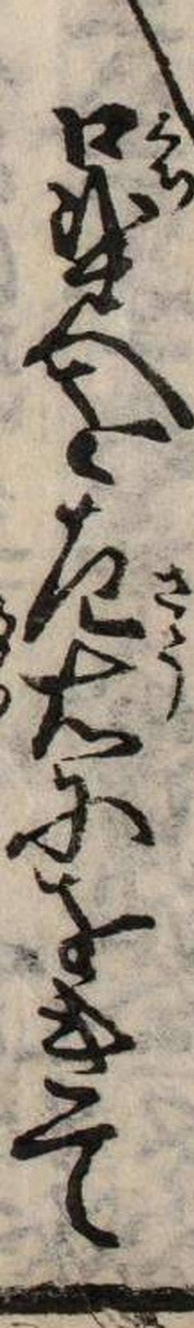口弐尺を左右にをきて
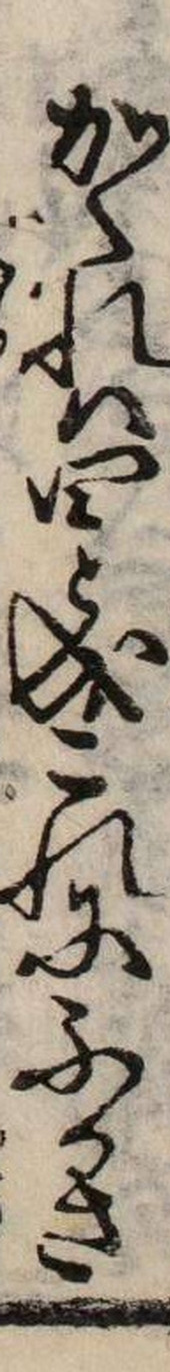かくれは四と成これにふかさ
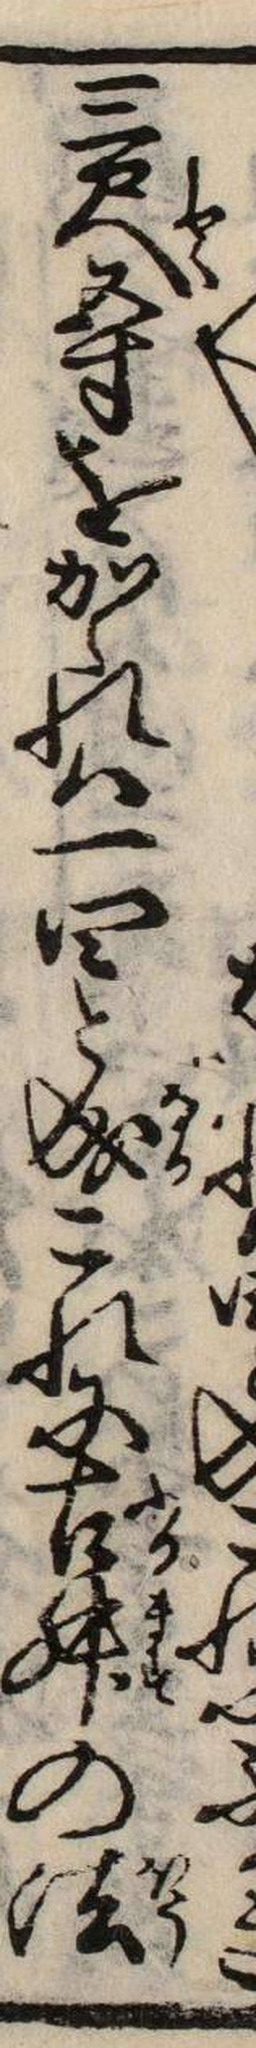三尺五寸をかくれは一四と成これに古舛の法
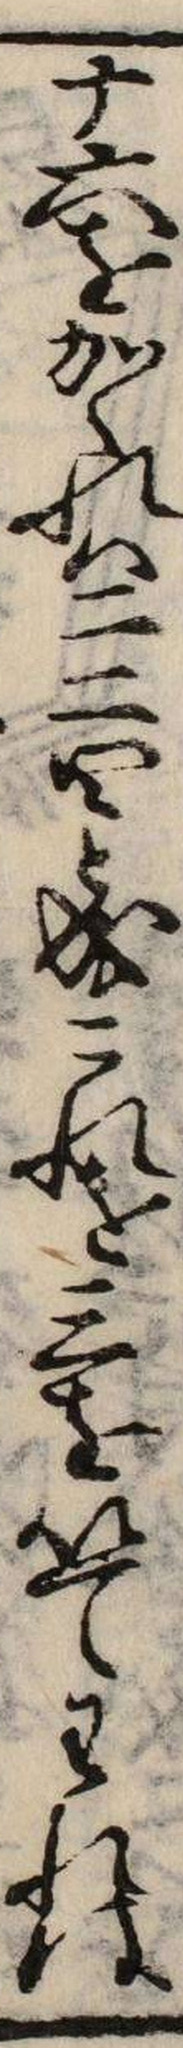十六をかくれは二二四と成これを三を以てわれは
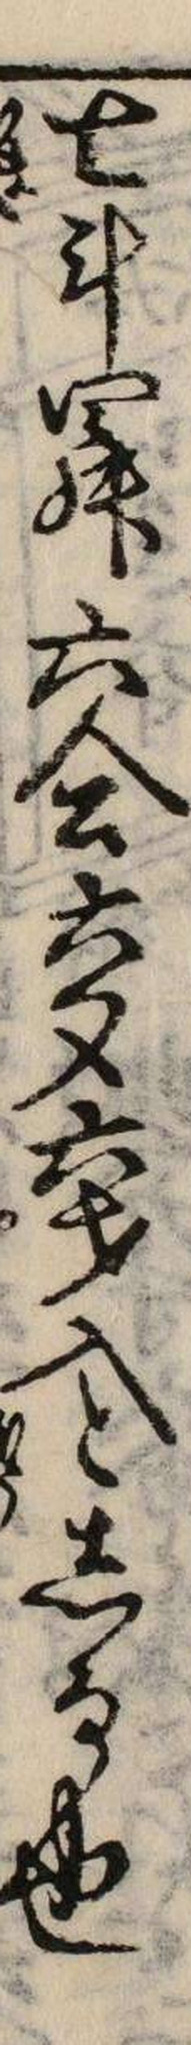七斗四升六合六勺六才入としる也
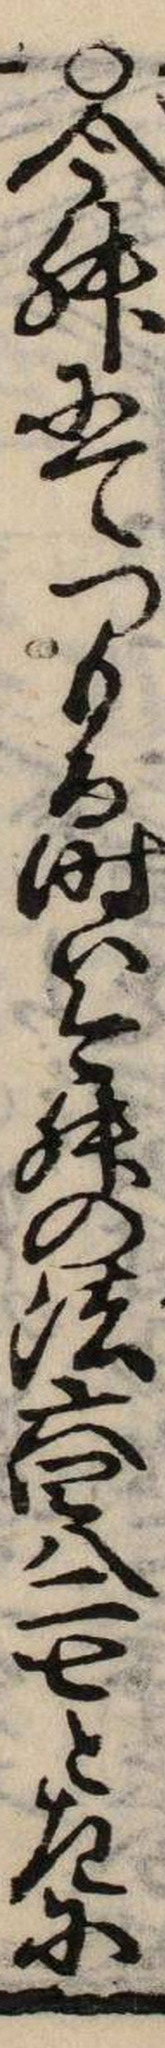○今舛にてつもる時は今舛の法六四八二七と左に
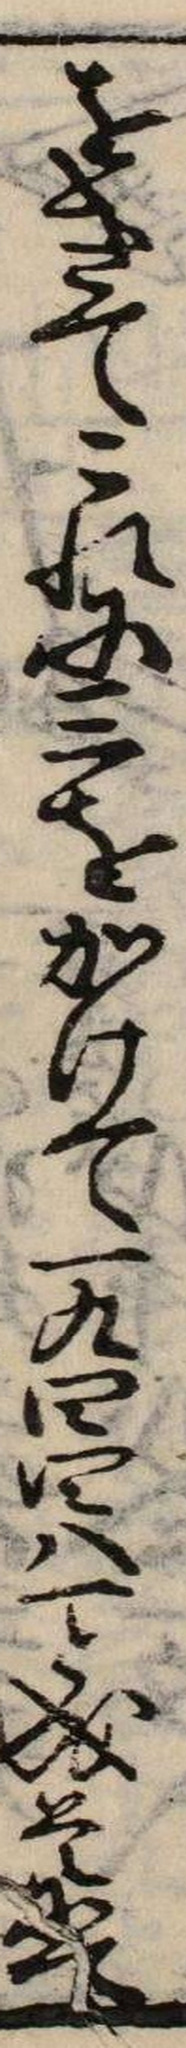をきてこれに三をかけて一九四四八一と成是にて
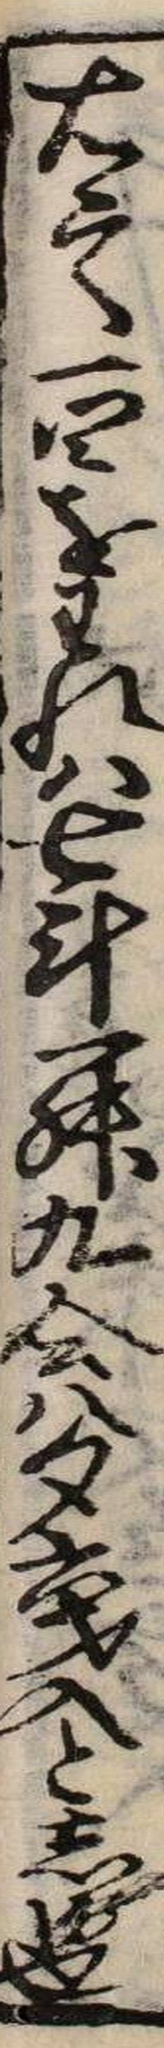右之一四をわれは七斗一升九合八勺六才入としる也

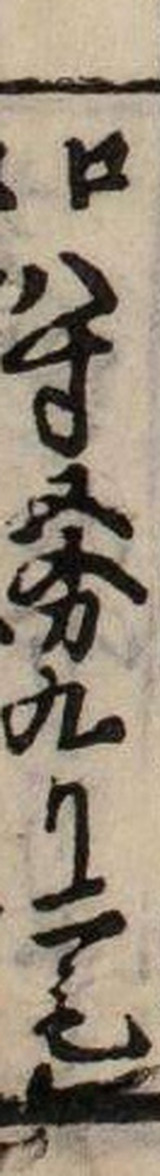四升口八寸五分九り二毛
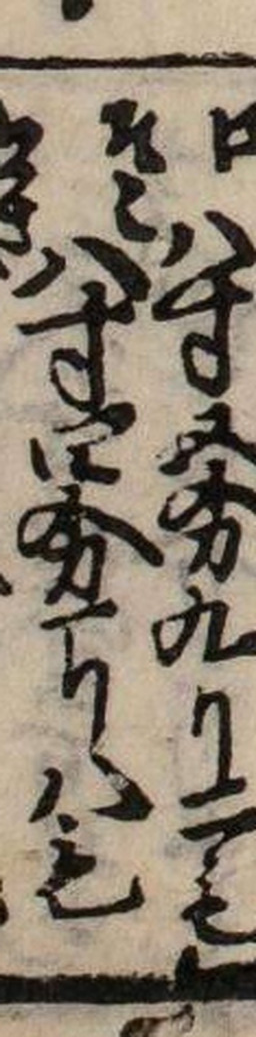そこ八寸四分一り八毛
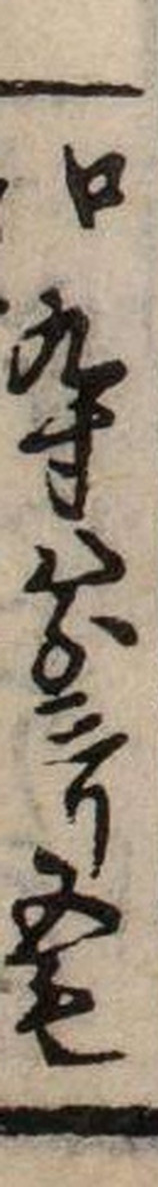六升口九寸八分三り五毛

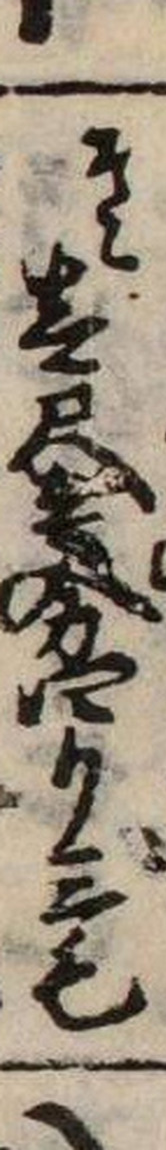そこ壱尺壱分四り三毛
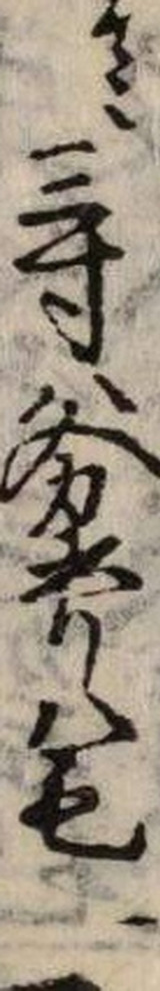そこ三寸八分六り八毛
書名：塵劫記（寛永11年自跋、京都府立京都学・歴彩館追貴8）
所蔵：京都府立京都学・歴彩館 国文学研究資料館
